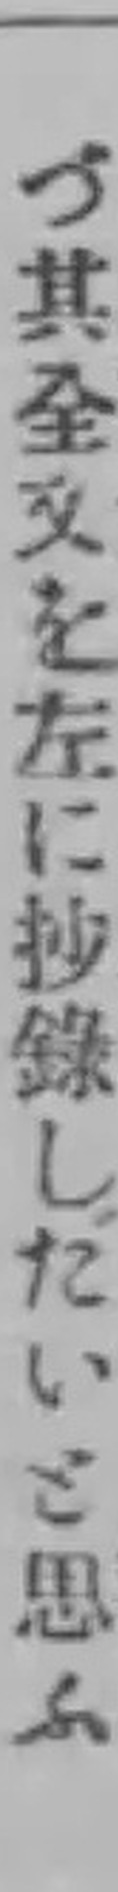づ其全文を左に抄録したいと思ふ
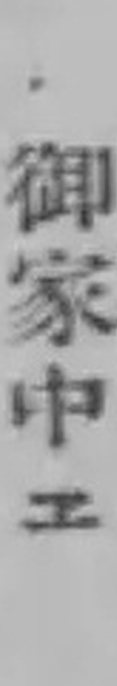御家中エ
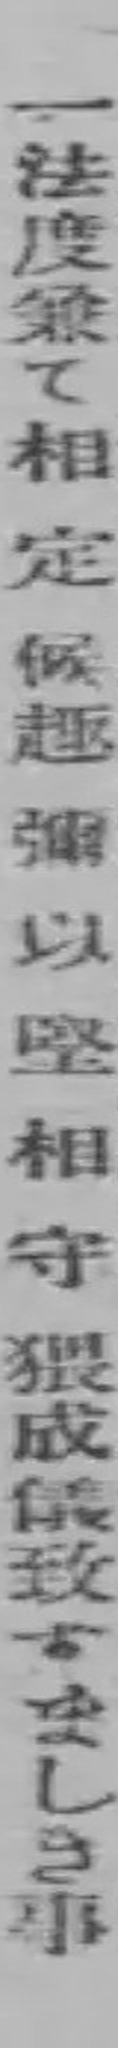一法度兼て相定候趣弥以堅相守猥成儀致すましき事
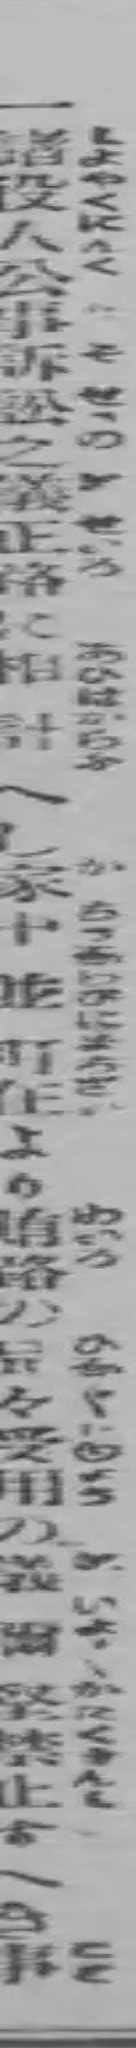一諸役人公事訴訟之儀正路に相計へし家中並町在より賄賂の品々受用の儀弥堅禁止すへき事
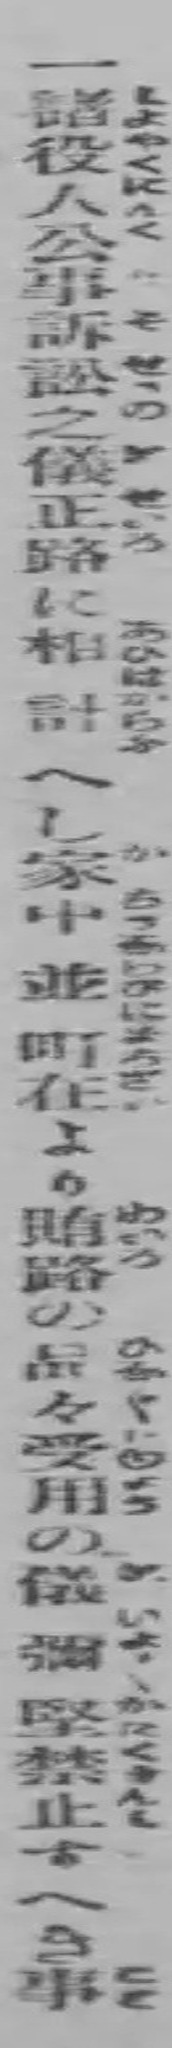一諸役人公事訴訟之儀正路に相計へし家中並町在より賄賂の品々受用の儀弥堅禁止すへき事
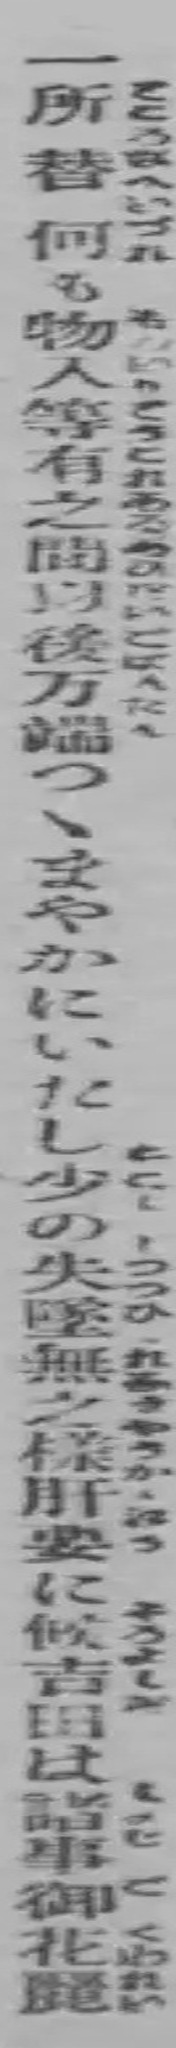一所替何も物入等有之間以後万端つゝまやかにいたし少の失墜無之様肝要に候吉田は諸事御花麗
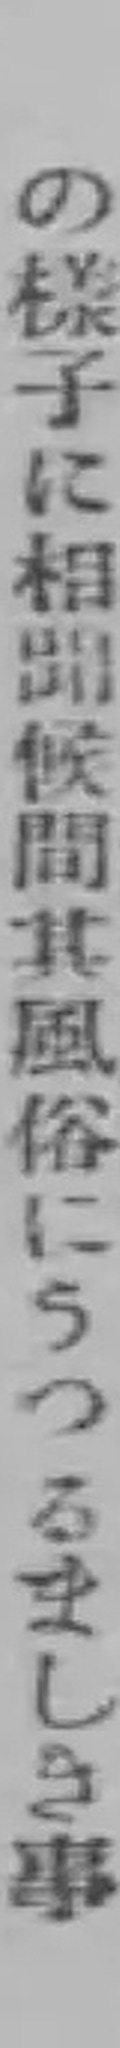の様子に相聞候間其風俗にうつるましき事
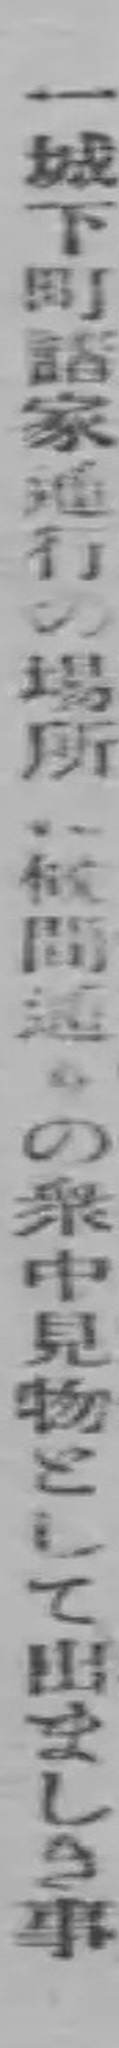一城下町諸家通行の場所に候間通りの衆中見物として出ましき事
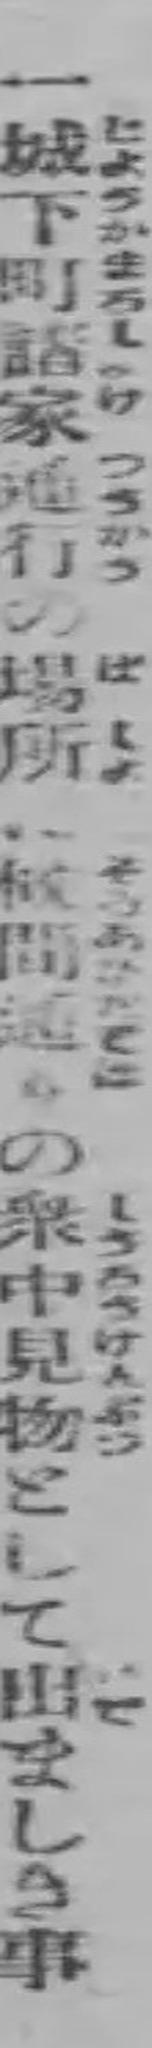一城下町諸家通行の場所に候間通りの衆中見物として出ましき事
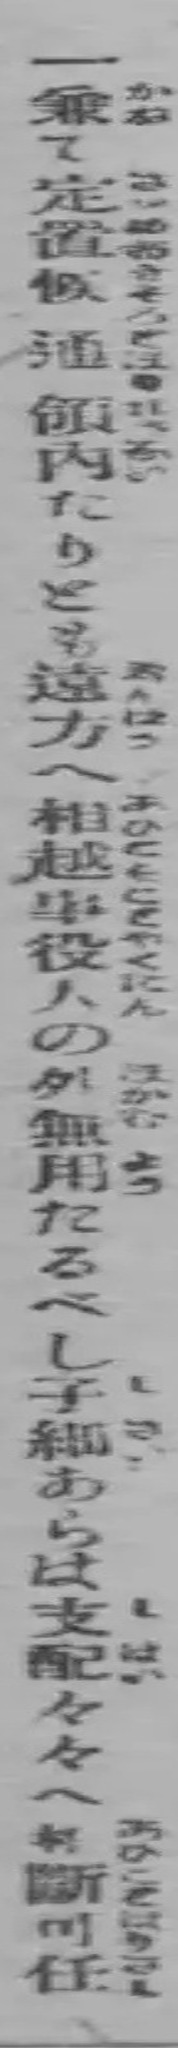一兼て定置候通領内たりとも遠方へ相越事役人の外無用たるべし子細あらは支配々々へ相断可任

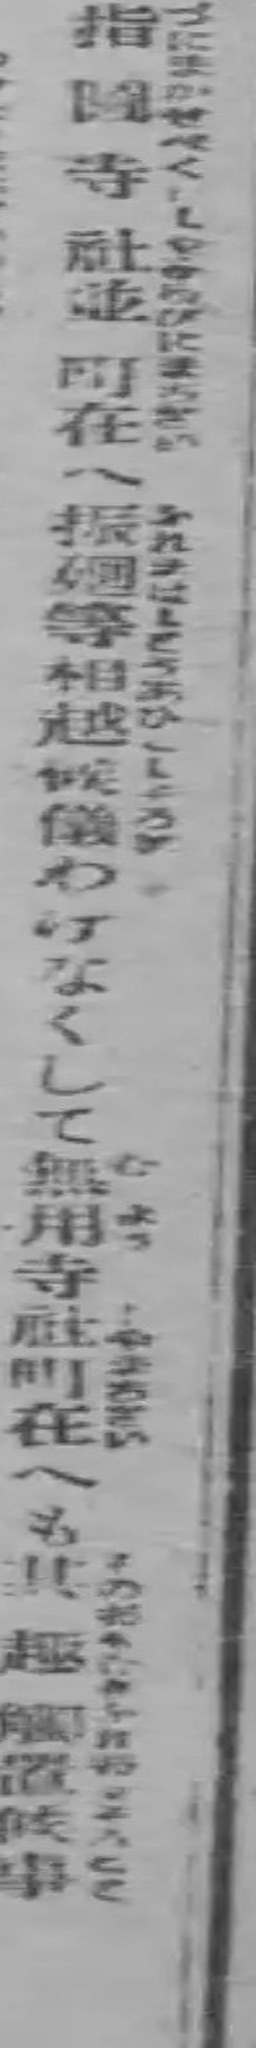指図寺社並町在へ振廻等相越候儀わけなくして無用寺社町在へも其趣触置候事
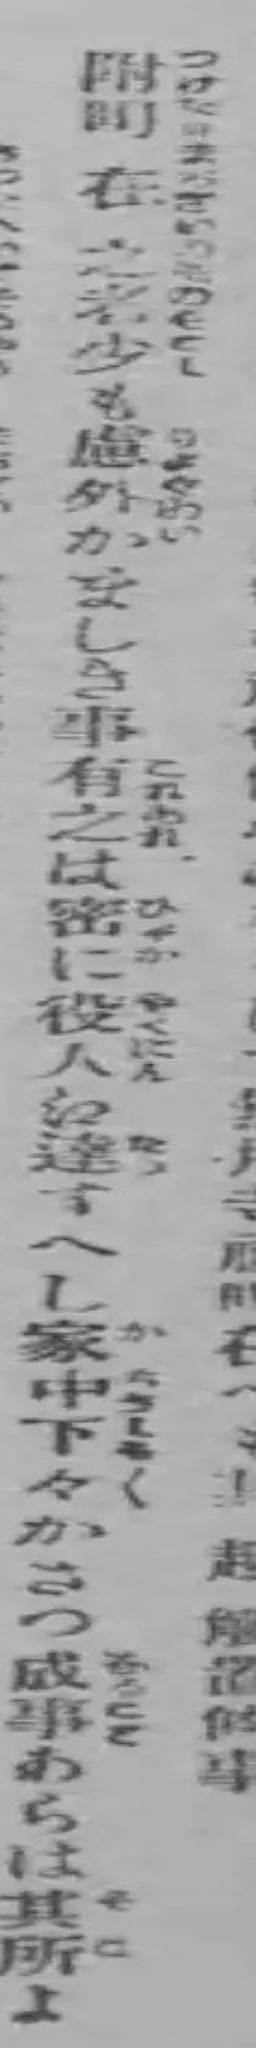附町在之者少も慮外がましき事有之は密に役人え達すへし家中下々かさつ成事あらは其所よ
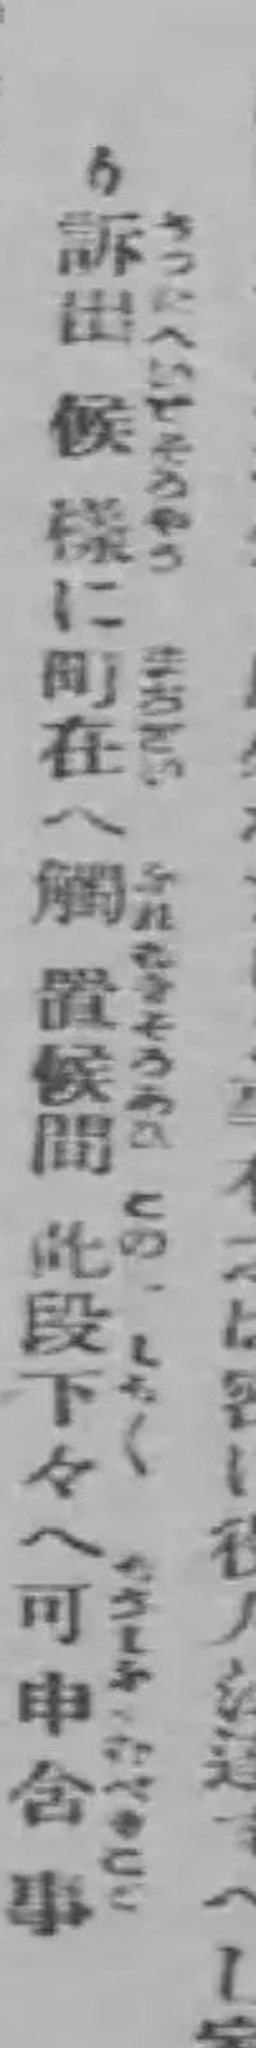り訴出候様に町在へ触置候間此段下々へ可申含事
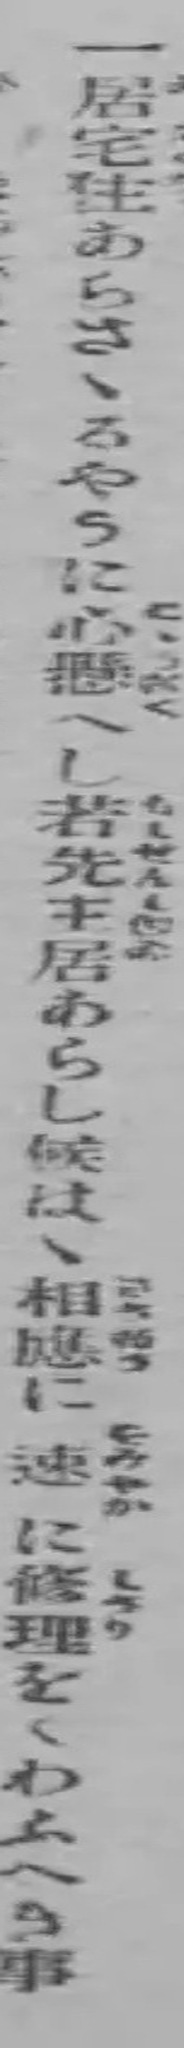一居宅住あらさゝるやうに心懸へし若先主居あらし候はゝ相応に速に修理をくわふへき事
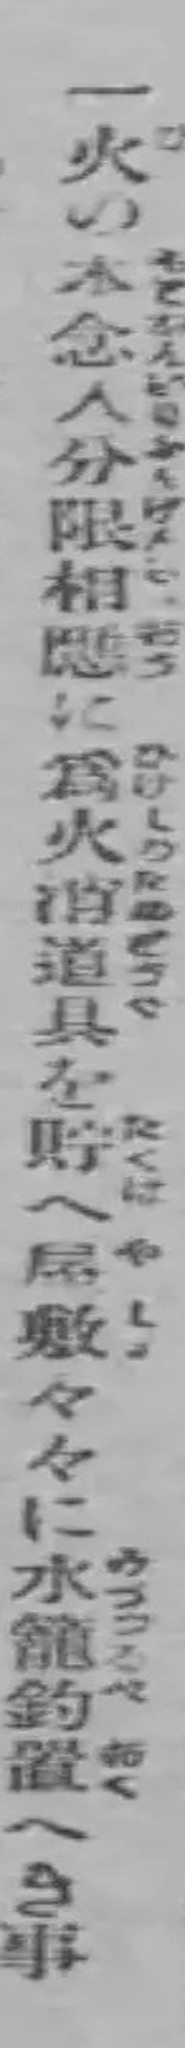一火の本念入分限相応に為火消道具を貯へ屋敷々々に水籠釣置へき事
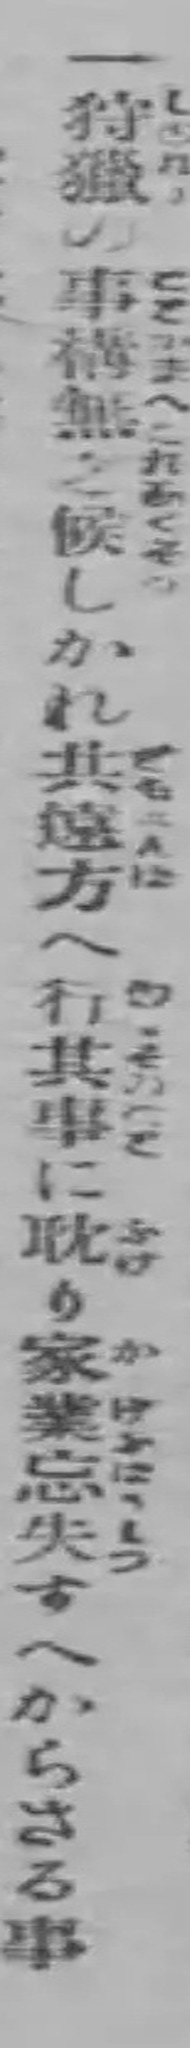一狩猟の事構無之候しかれ共遠方へ行其事に耽り家業忘失すへからさる事
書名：豊橋市史談
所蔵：国立国会図書館 National Diet Library, JAPAN
